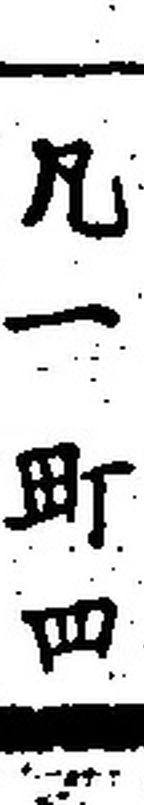凡一町四
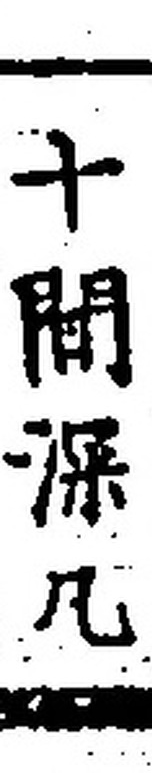十間深凡
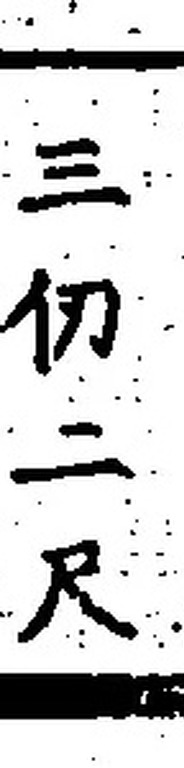三仞二尺
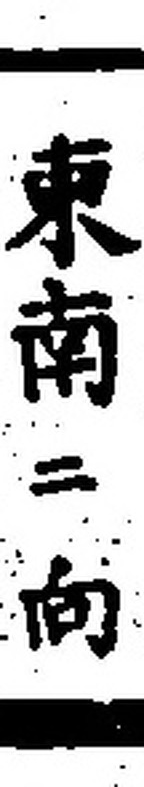東南ニ向
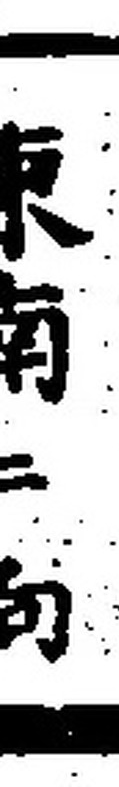東南ニ向
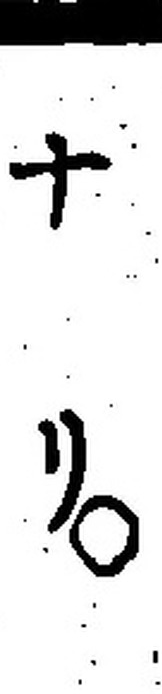ナリ。
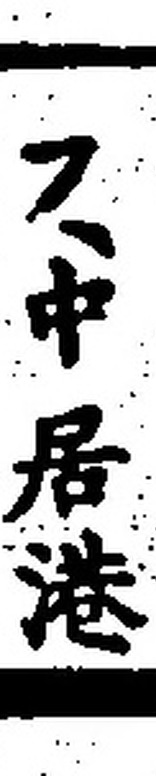フ、中居港
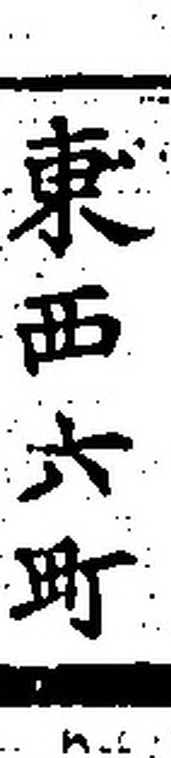東西六町
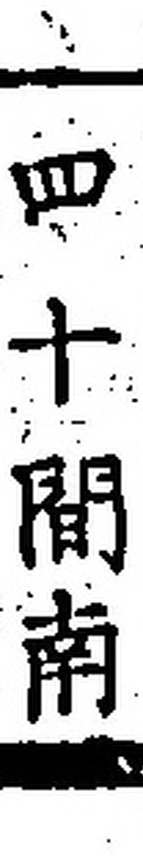四十間南
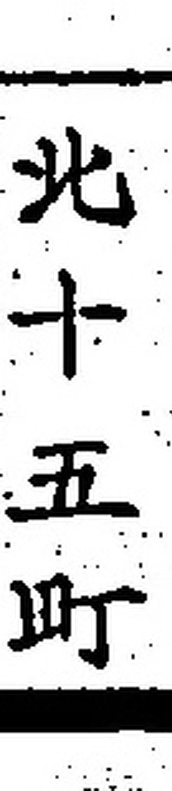北十五町
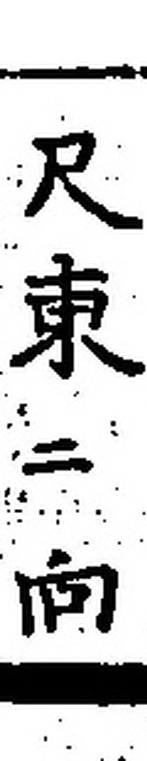尺東ニ向
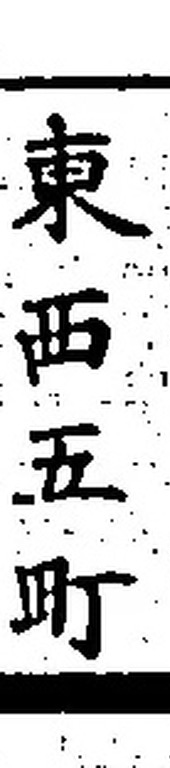東西五町
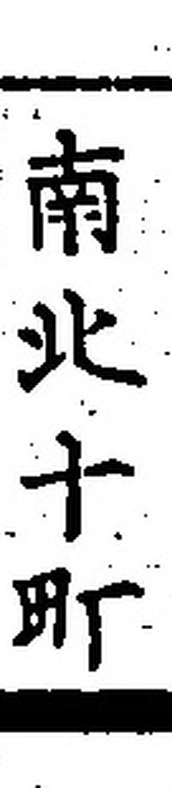南北十町
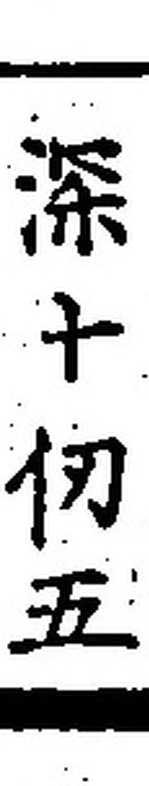深十仞五
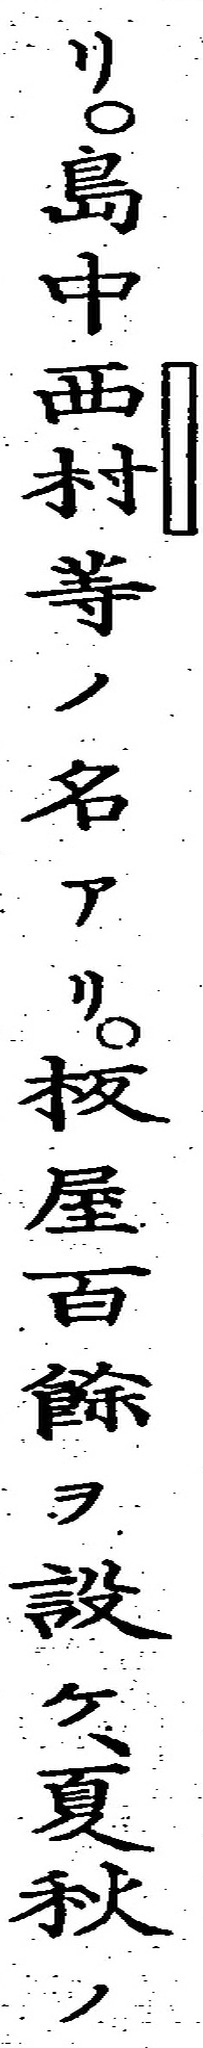リ。島中西村等ノ名アリ。板屋百余ヲ設ケ、夏秋ノ
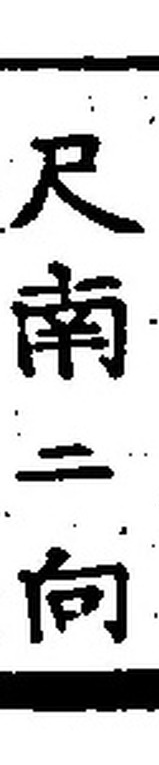尺南ニ向
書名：能登地誌略
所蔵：国立国会図書館 National Diet Library, JAPAN
